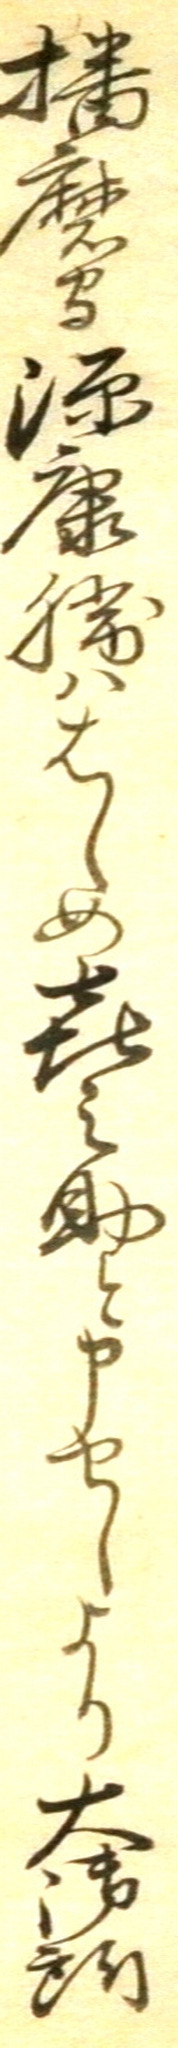播磨国源康勝ははしめ喜之助と申せしより大御所
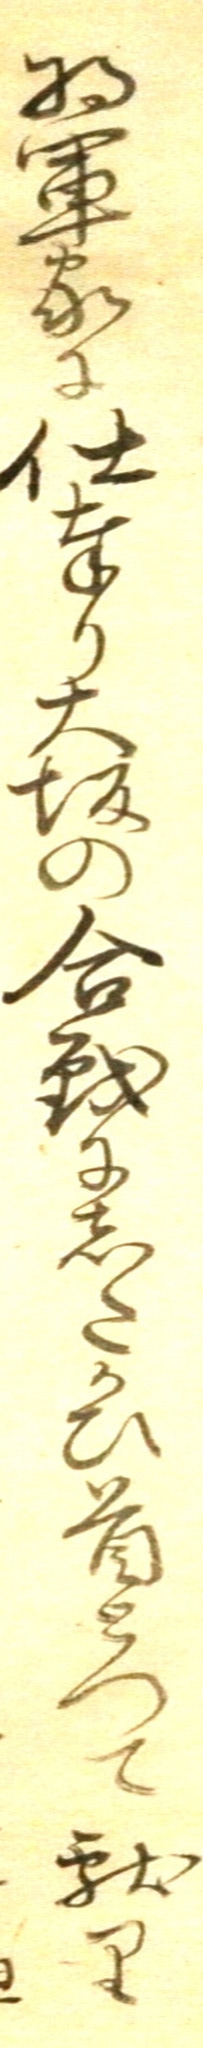将軍家に仕奉り大坂の合戦にしたかひ首とつて献り
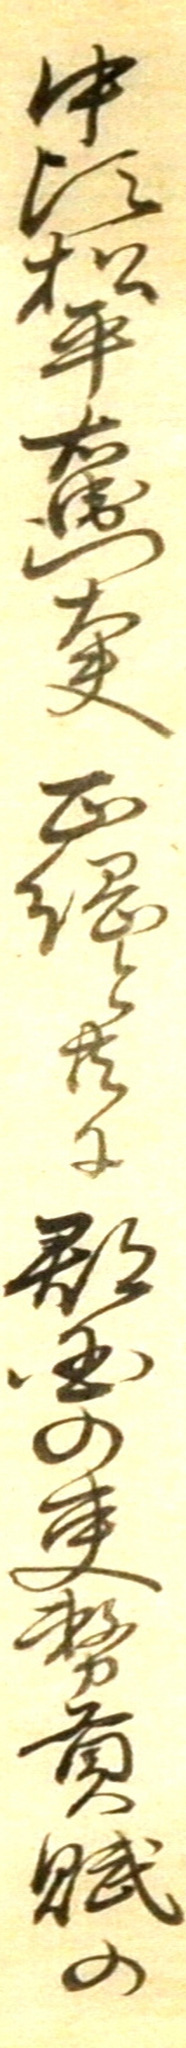中頃松平右衛門大夫正綱と共に郡国の吏務貢賦の
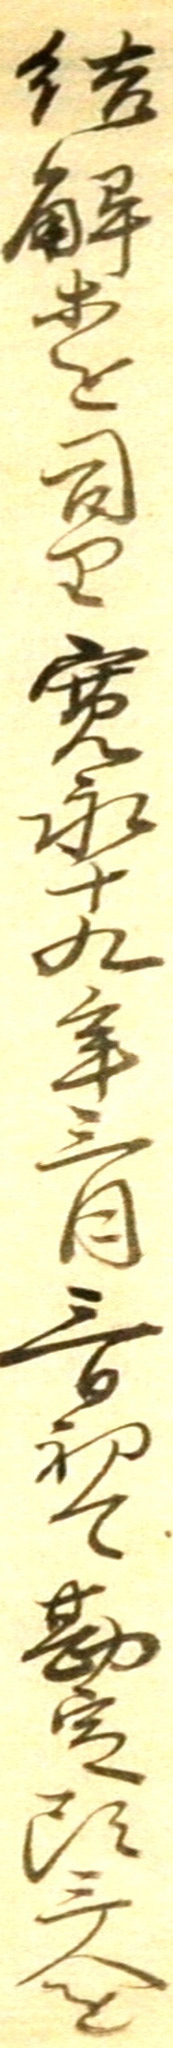結解等を司り寛永十九年三月三日初て勘定頭三人を
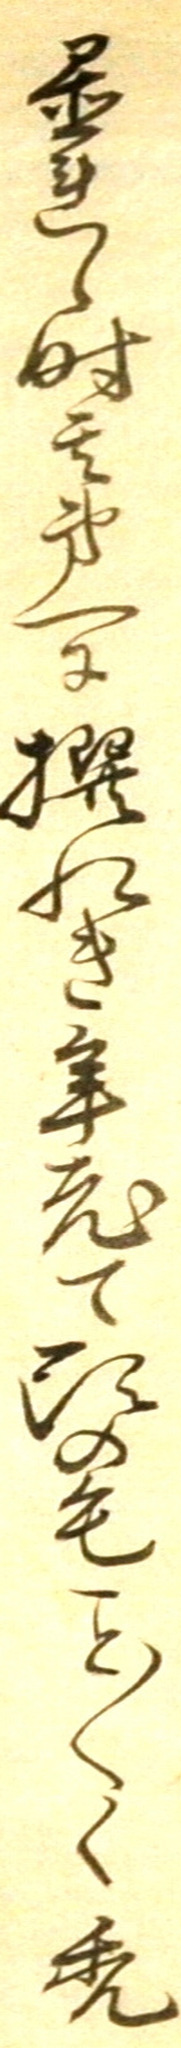置れし時其第一に撰れき年老て頭の毛こと〳〵く禿

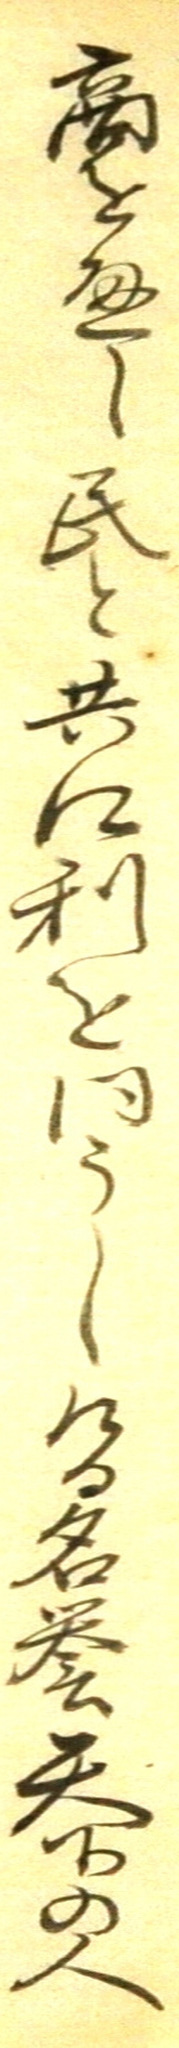商を通し民と共に利を同うしける名誉天下の人

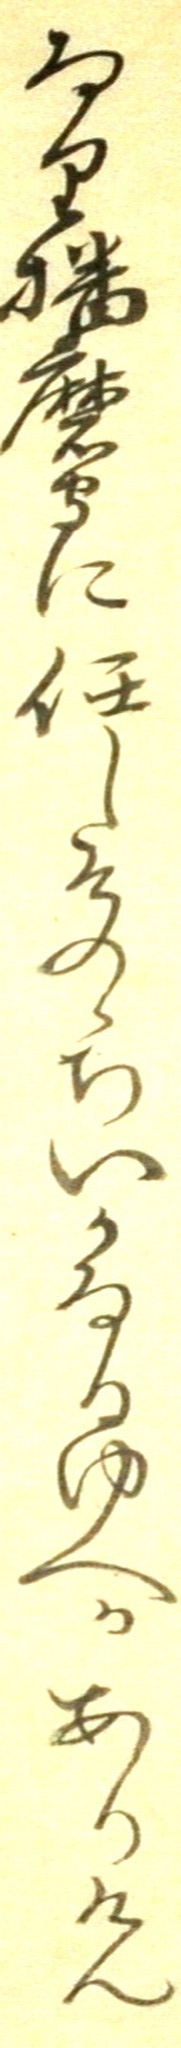なり播磨守に任しそのゝちいかなるゆへにありけん
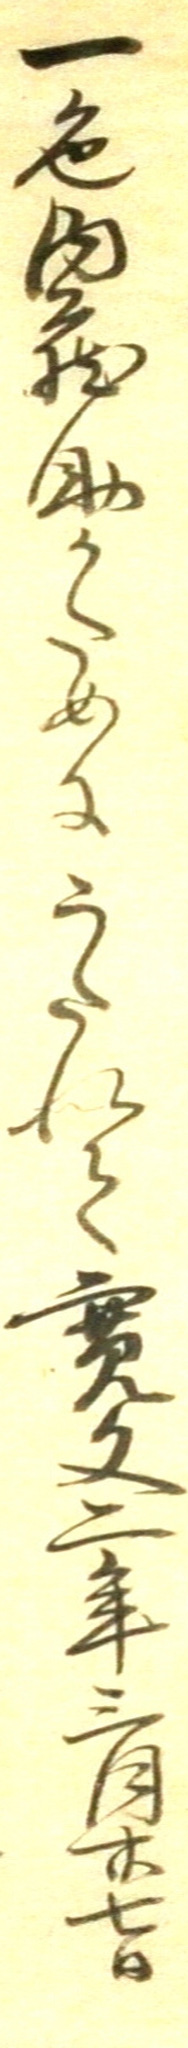一色内蔵助かためにうたれて寛文二年三月廿七日
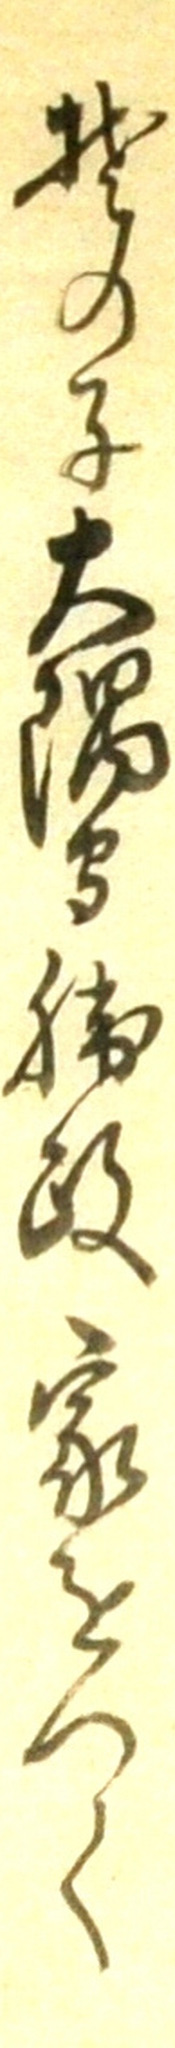その子大隅守勝政家をつく
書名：藩翰譜（五）
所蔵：伊那市立高遠町図書館・合同会社AMANE
